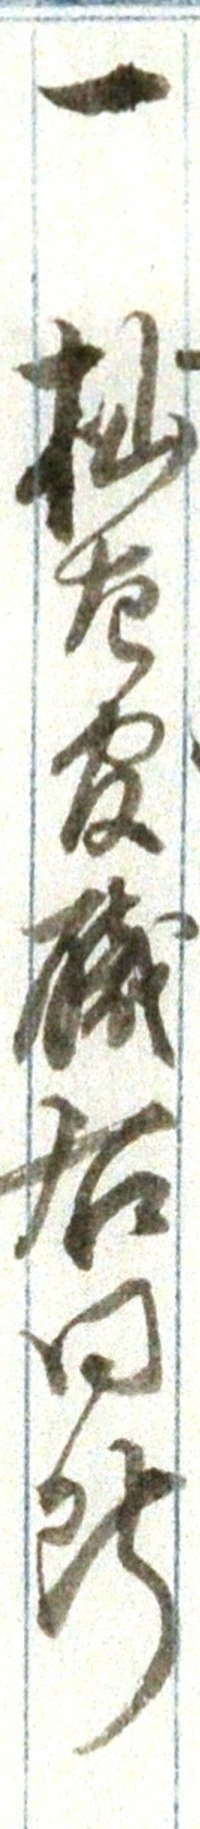一杣左官職右同断
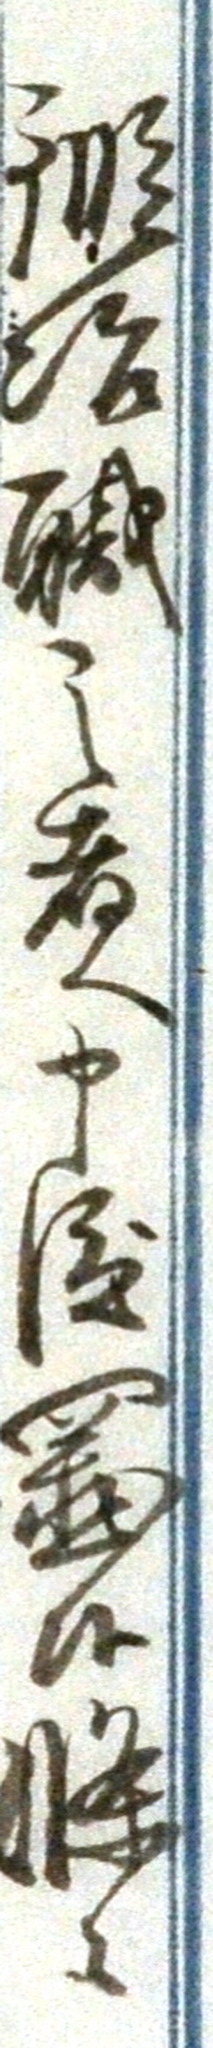鍛冶職之者へも申渡置候條々
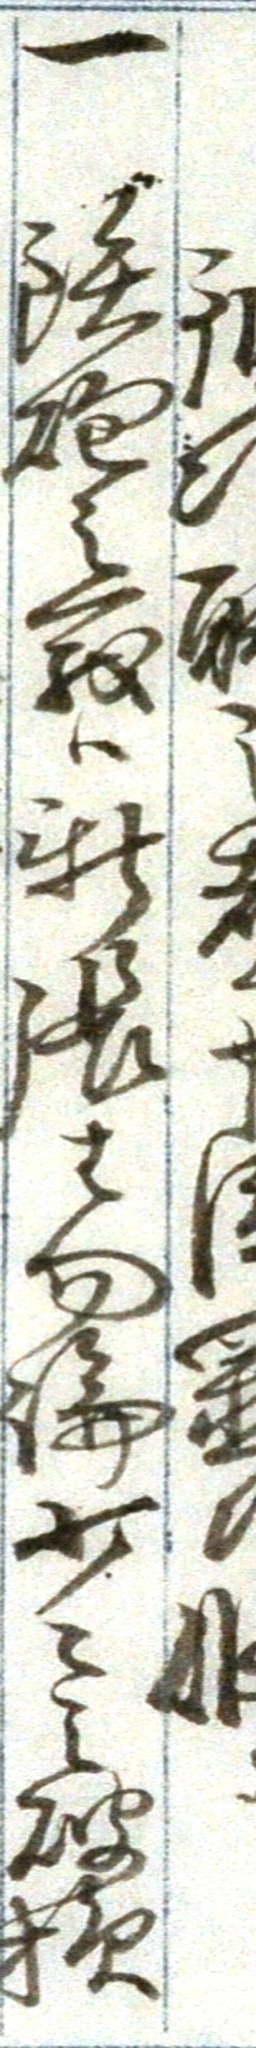一鉄砲之義ㇵ新張者勿論少々之破損
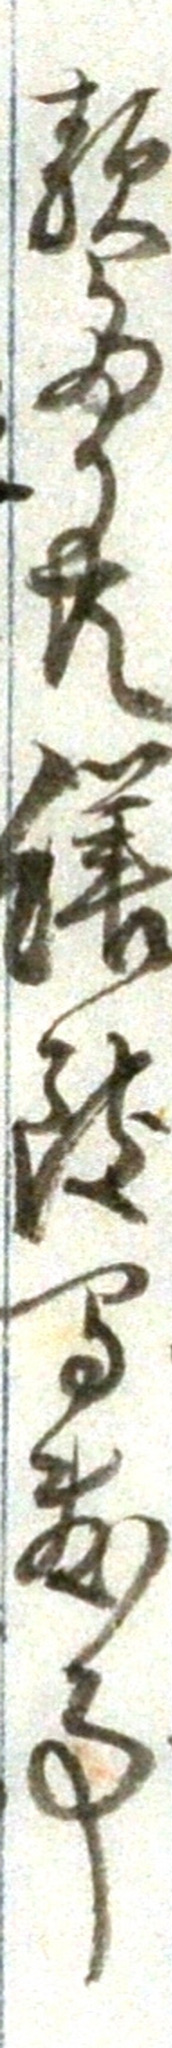類多ク共繕致間敷事
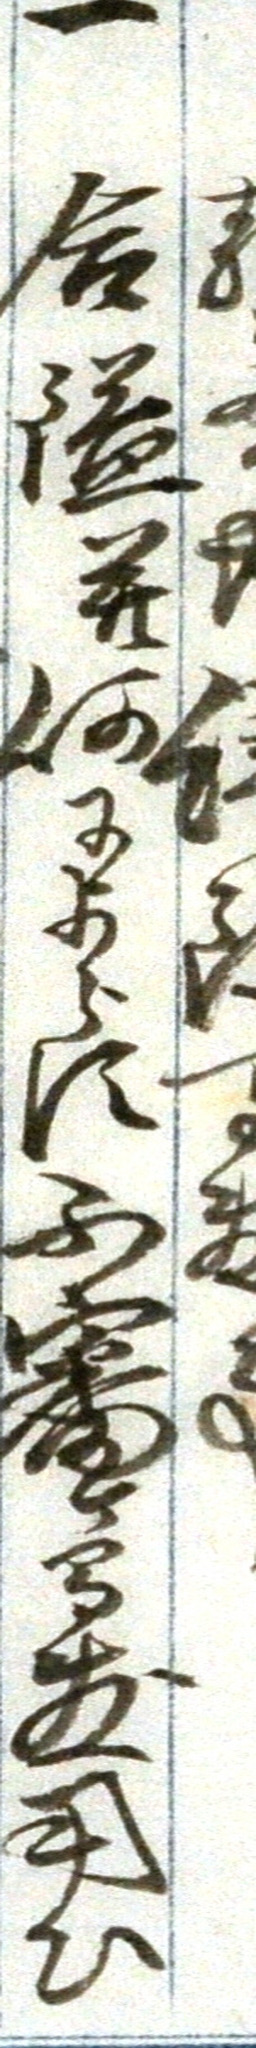一合鎰幷何尓よら須不審ヶ間敷用ひ
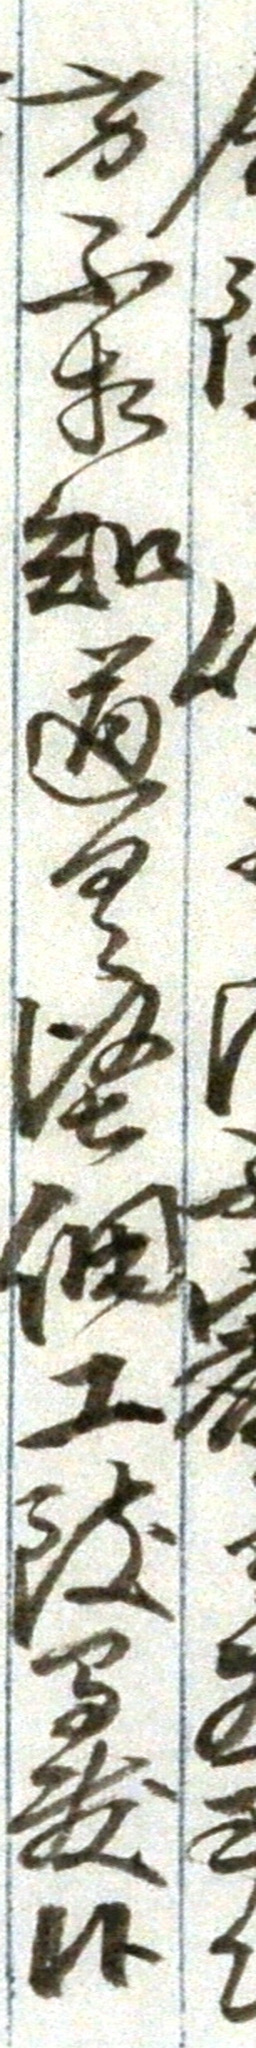方不相知道具堅細工致間敷候
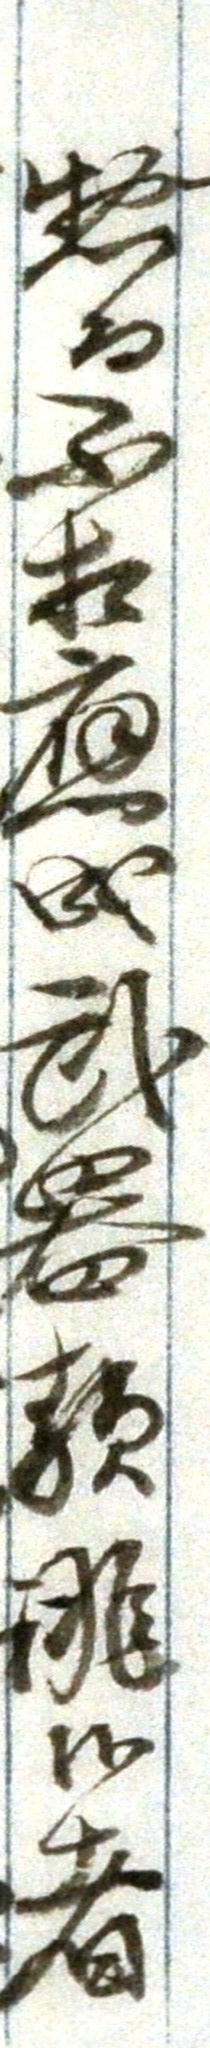一惣而不相応成武器類誂候者
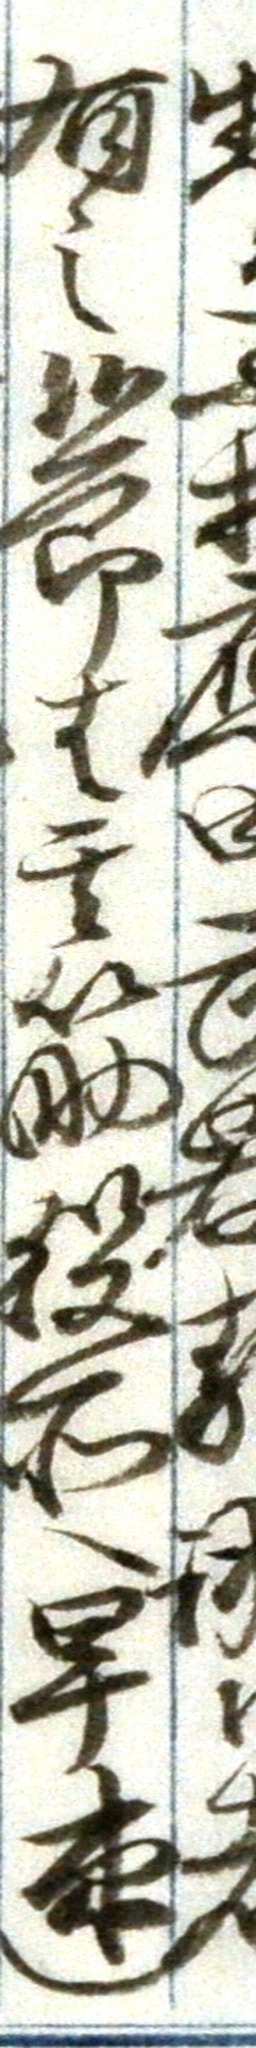有之候様節者其筋役所へ早速
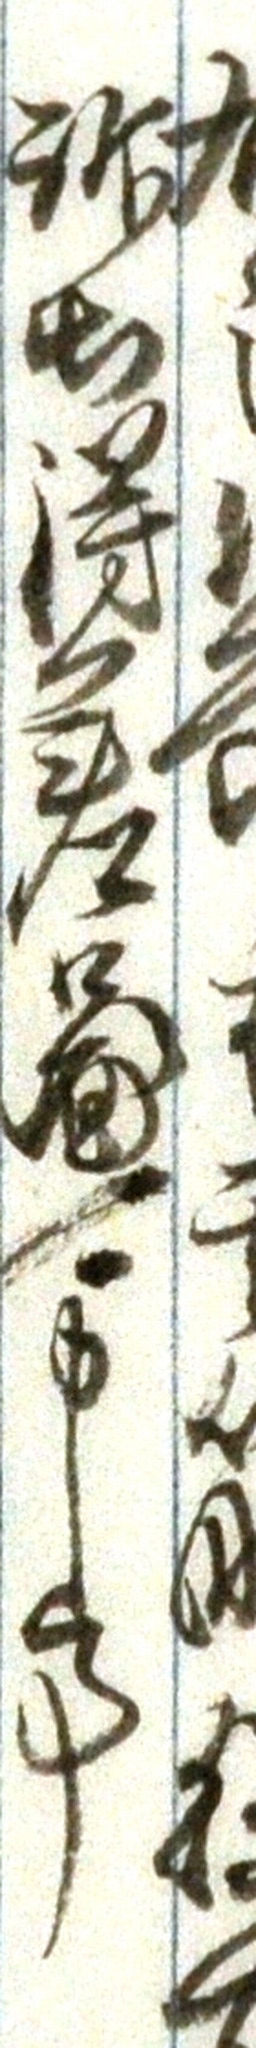訴出得差図可申事
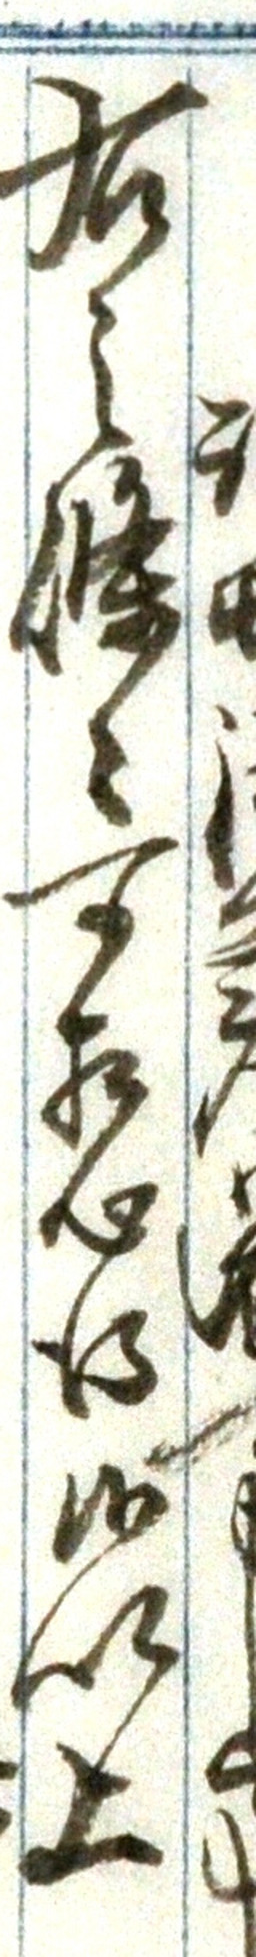右之條々可相心得候以上

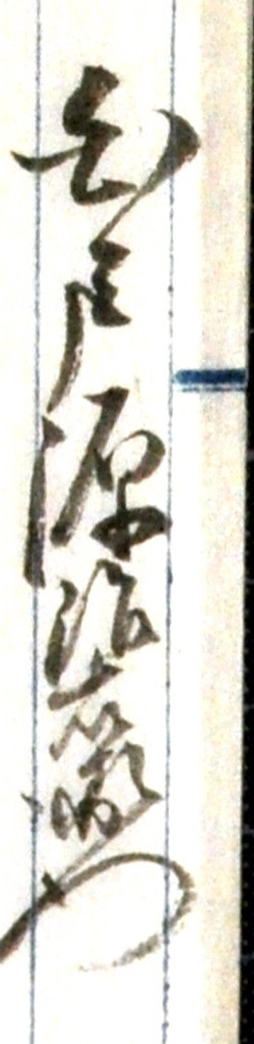白戸源作右衛門
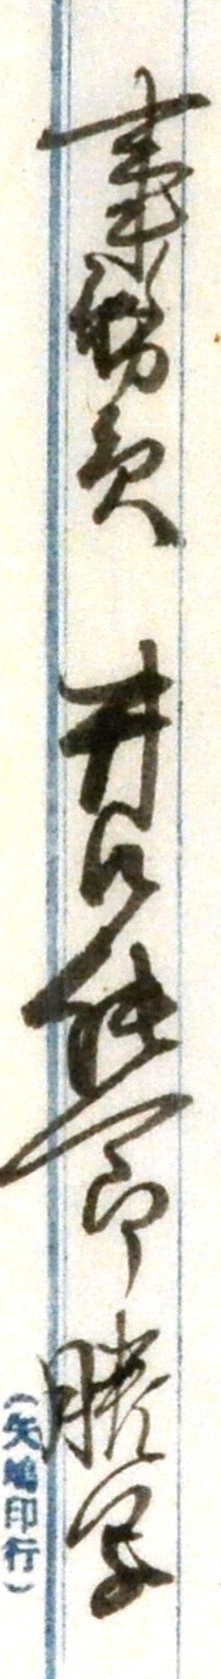事務員井口純一郎謄写
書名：職人内弟子年季御定書并ニ鍛冶職ヘ申渡書
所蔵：伊那市立高遠町図書館・合同会社AMANE
